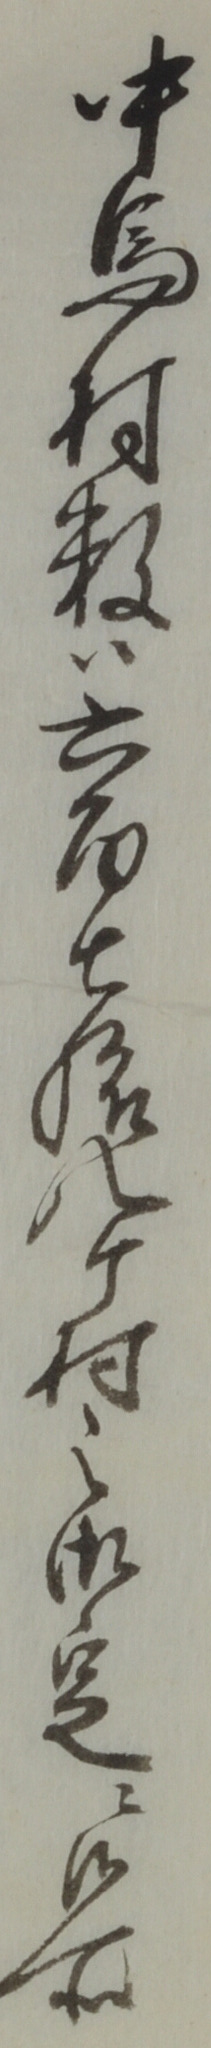中馬村数ハ六百七拾八ヶ村之御定ニ候所
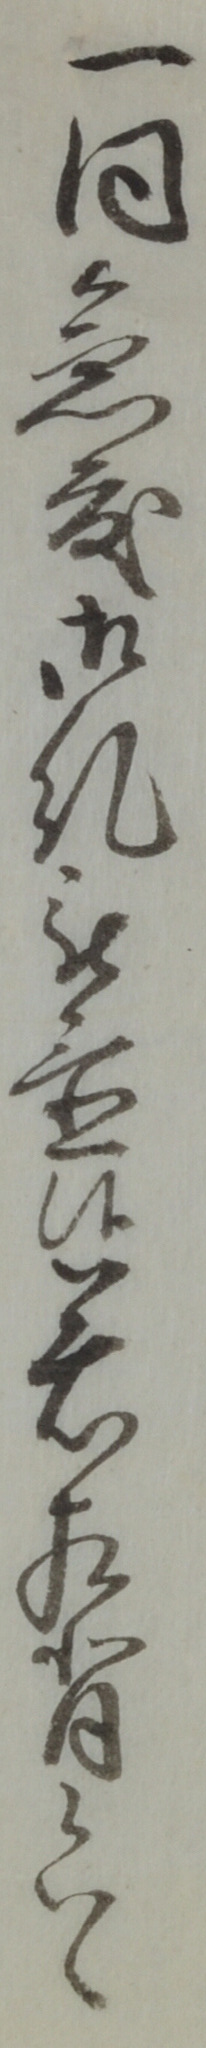一同急度御糺被置候若相背候ハヽ
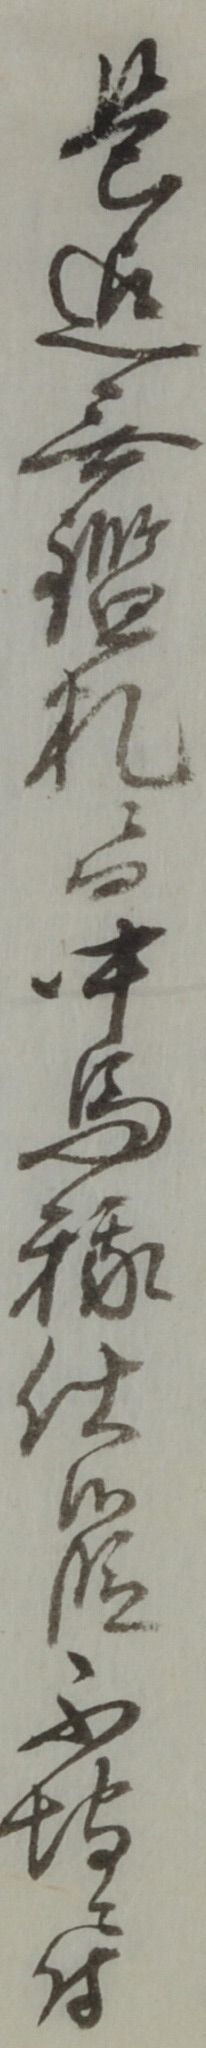是迄無鑑札ニ而中馬稼仕候段不埒ニ付
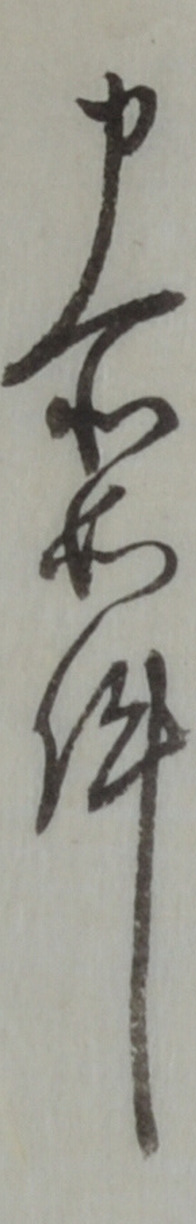申所如件
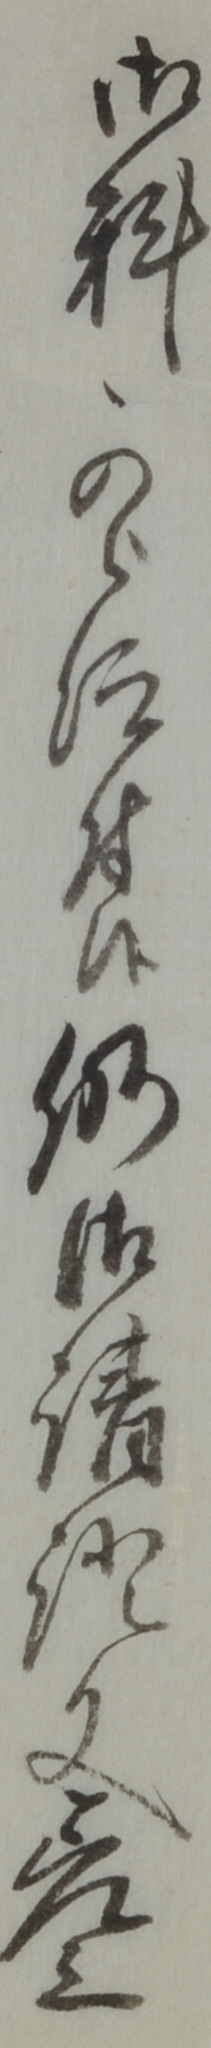御科可被仰付候仍御請証文差上
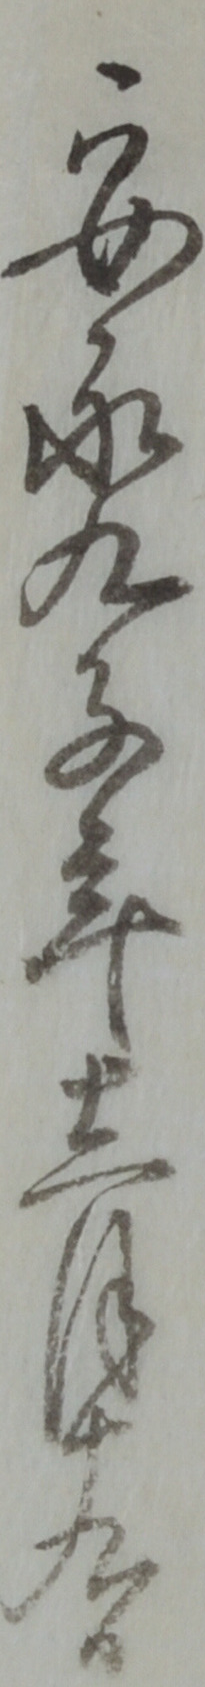安永九子年十二月十九日
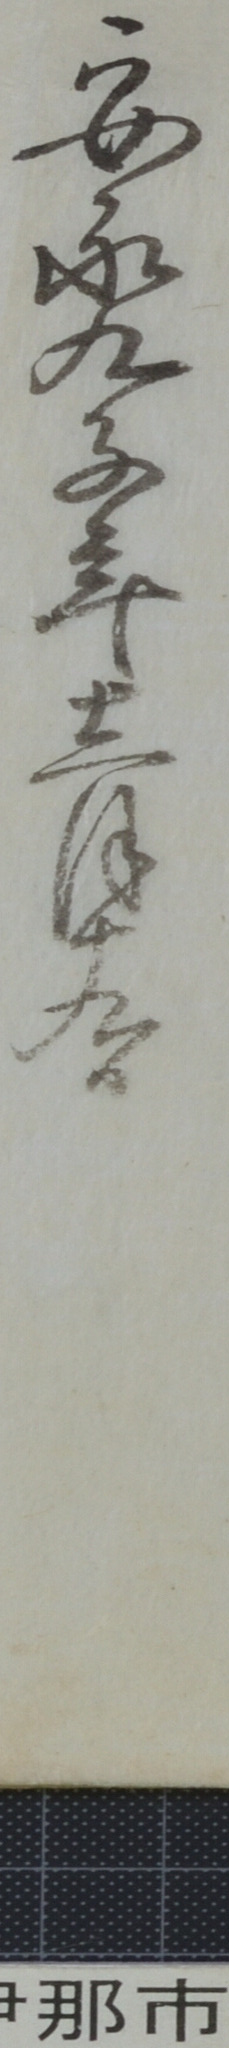安永九子年十二月十九日

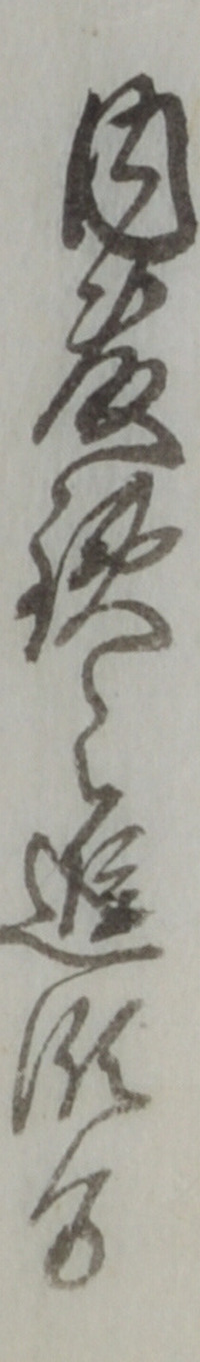内藤鉄之進領分
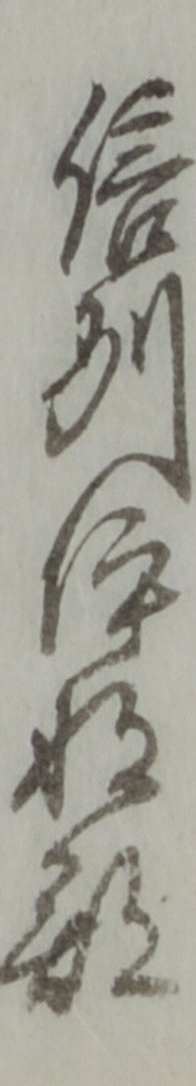信州伊那郡
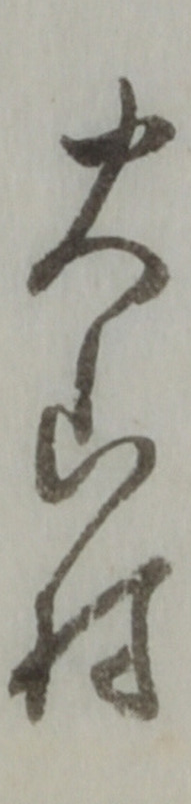火山村
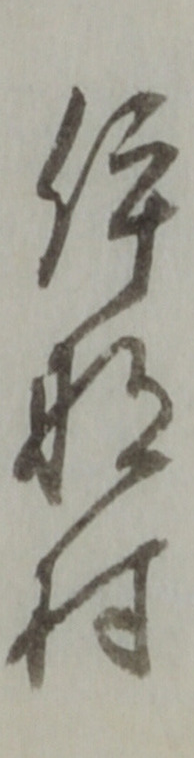伊那村
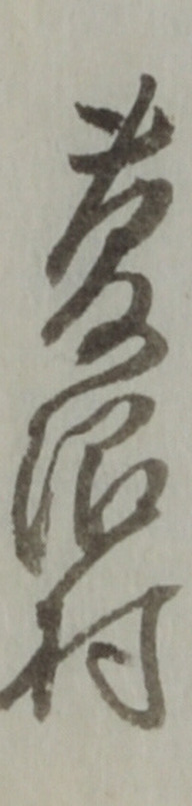菅沼村
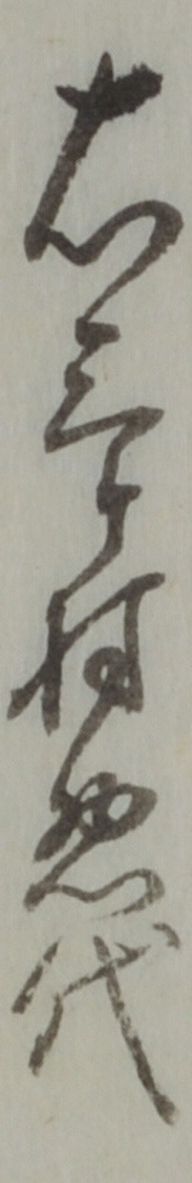右三ヶ村惣代
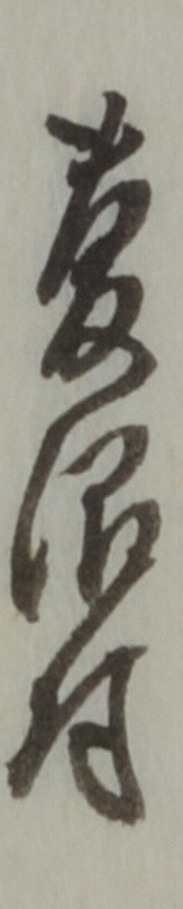菅沼村
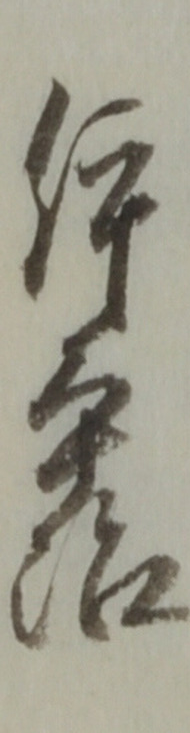伊平治
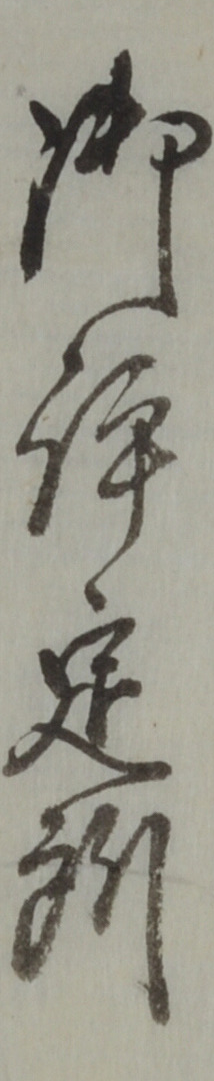御評定所
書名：差上申一札之事
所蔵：伊那市立高遠町図書館・合同会社AMANE
